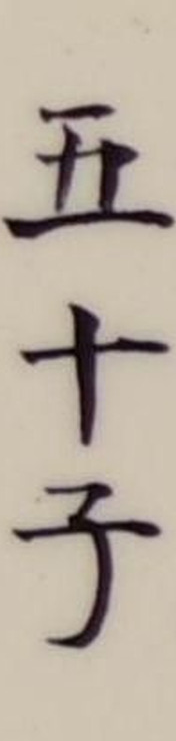五十子
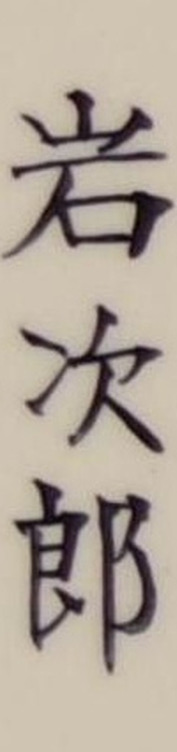岩次郎

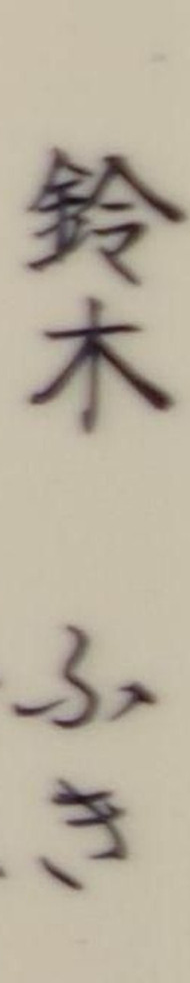鈴木ふき
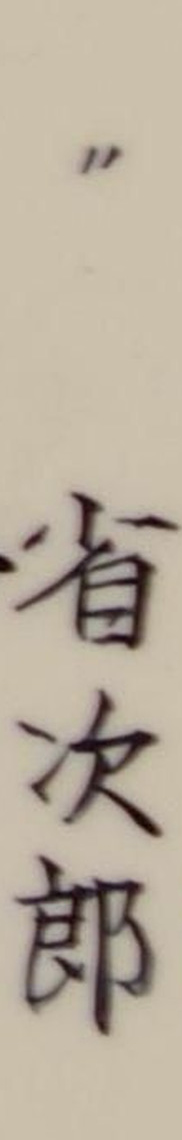省次郎
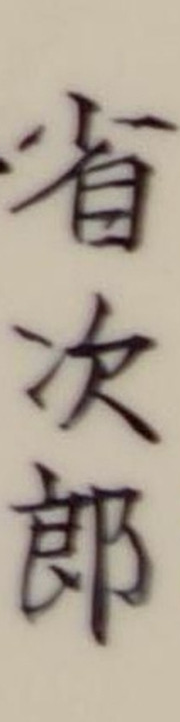省次郎
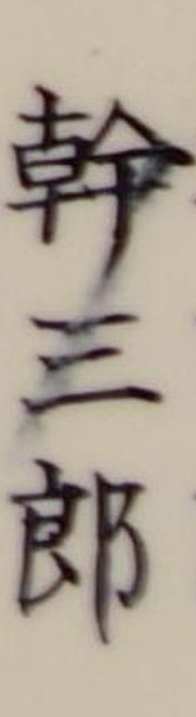幹三郎
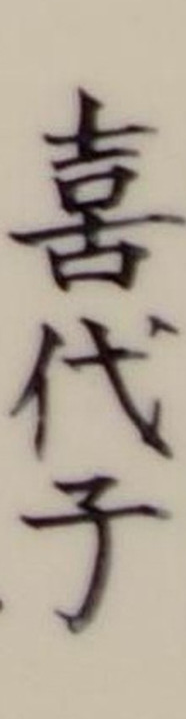喜代子
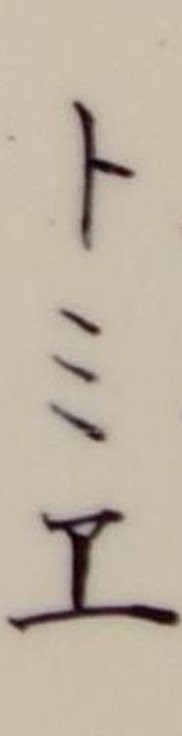トミエ
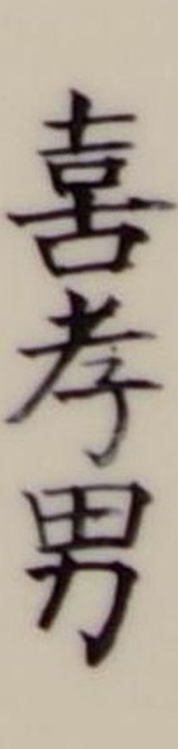喜孝男
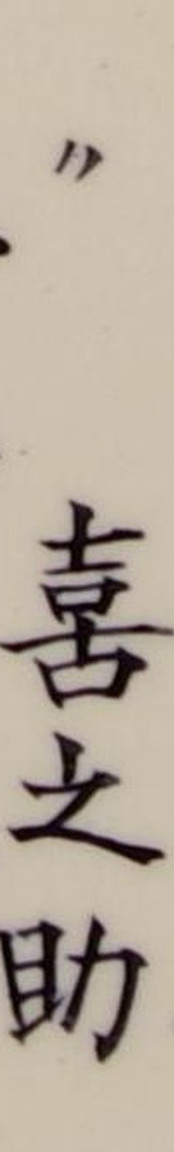喜之助
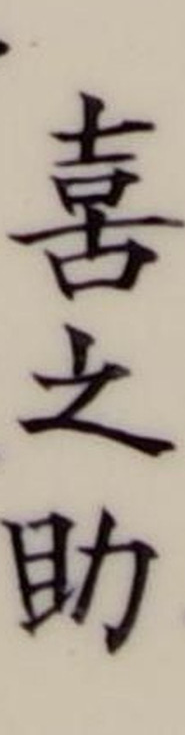喜之助
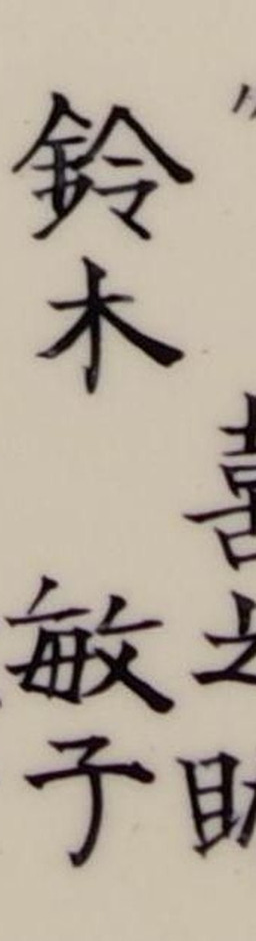鈴木敏子
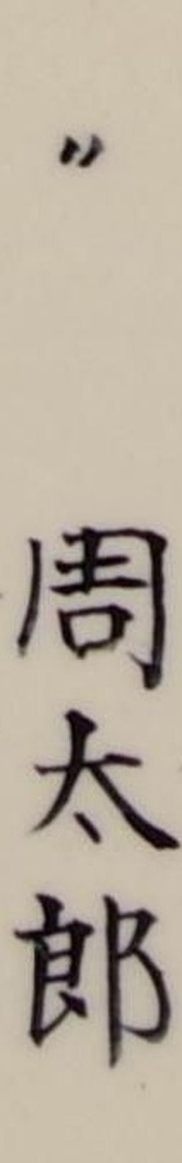周太郎
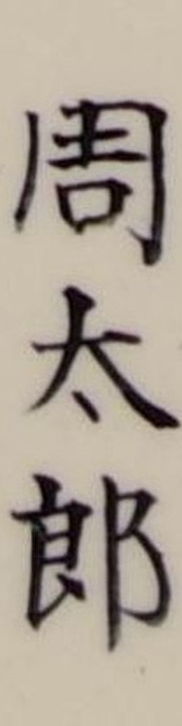周太郎
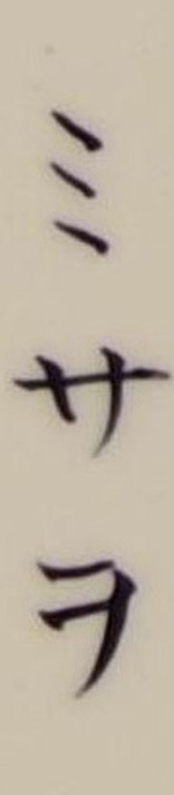ミサヲ
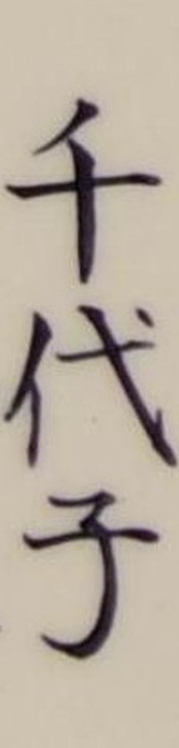千代子
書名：M~S
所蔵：高野山金剛峯寺
